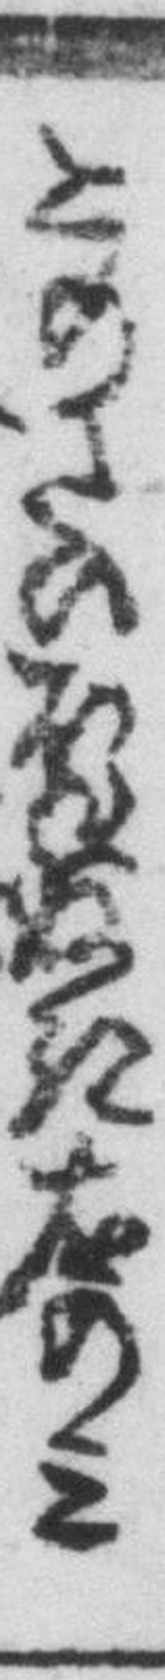とのたいほねぬき右のミ
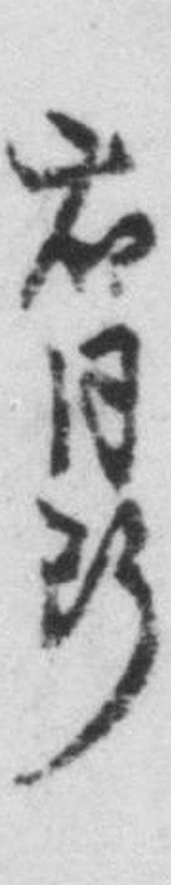右同段
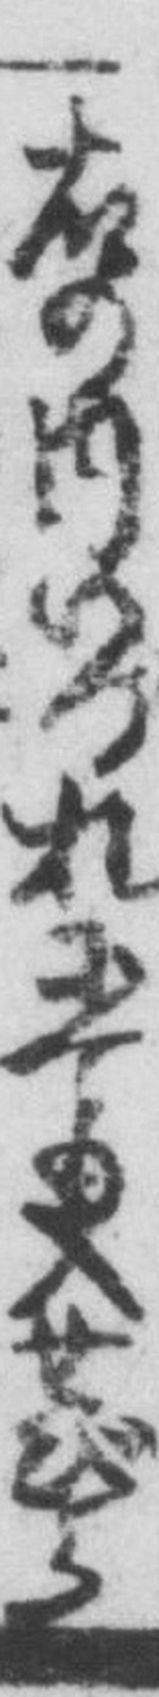右の内いづれにても入せびら
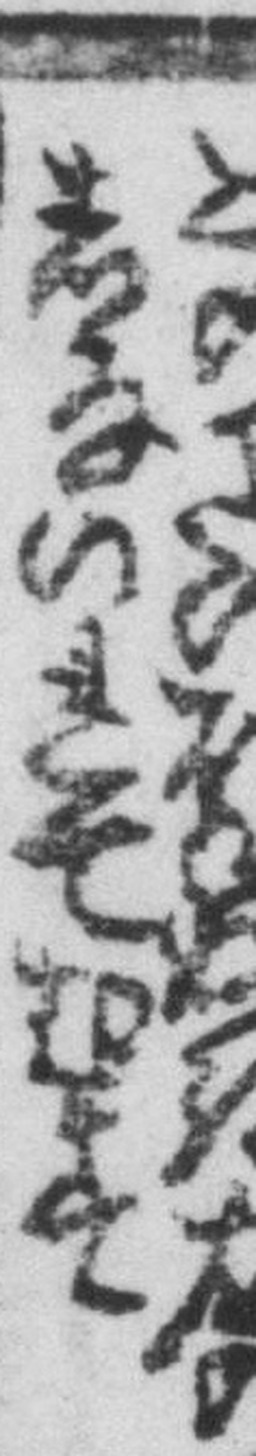しるいれてむす
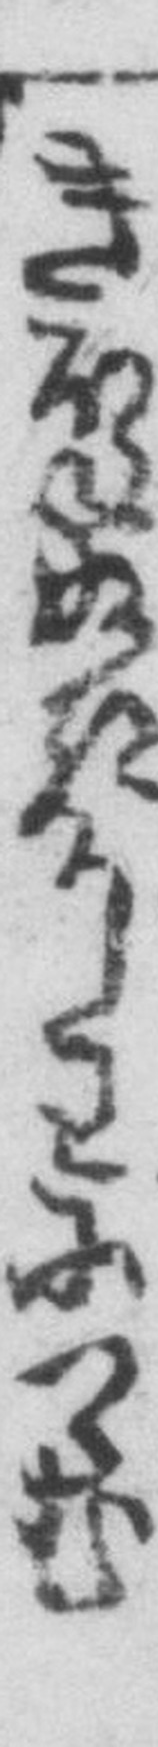きほねぬきかわにつゝむ
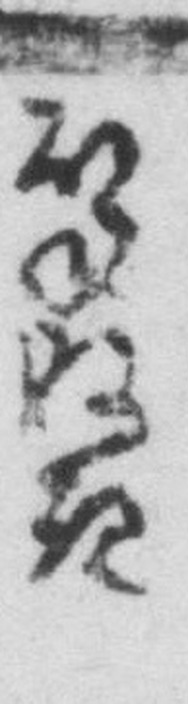ほねぬき
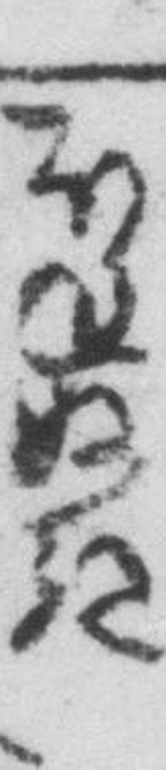ほねぬき
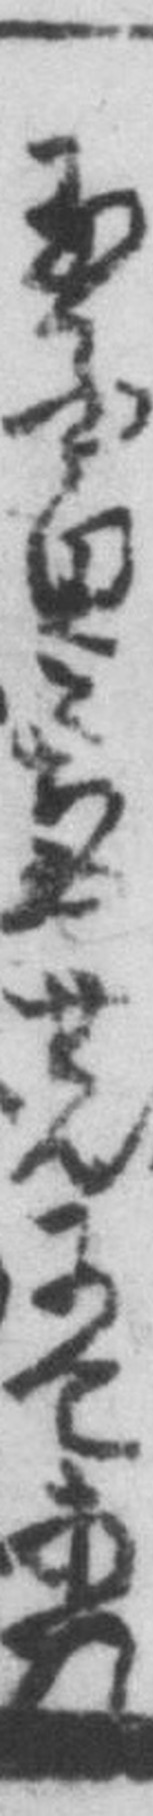玉子白ミちやせんにてあわ
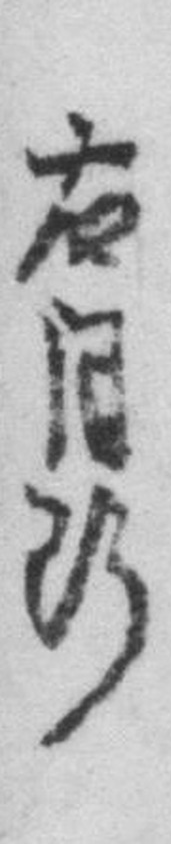右同段
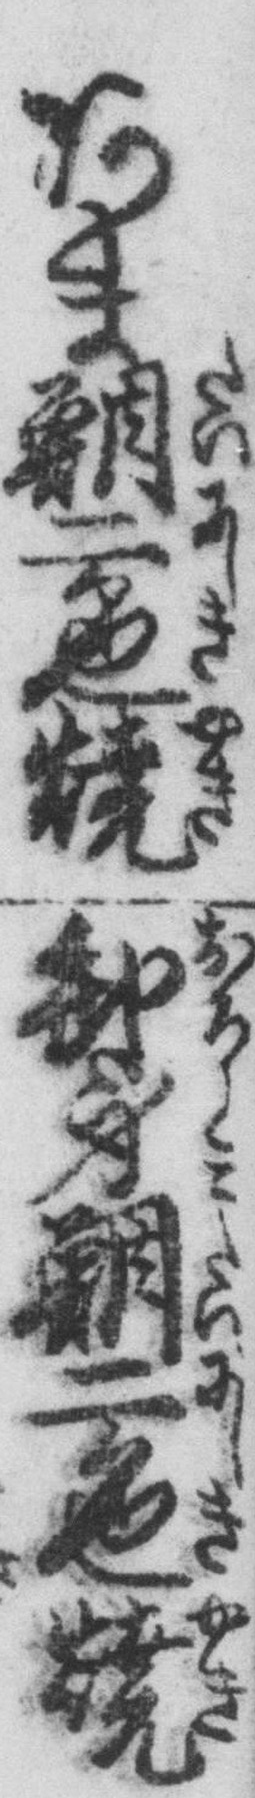あま鯛二色焼卸身鯛二色焼
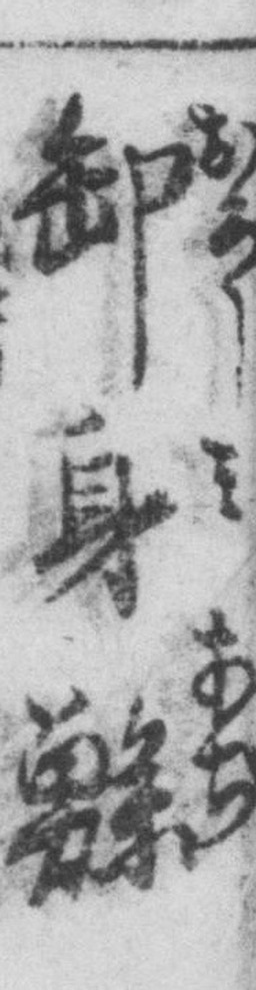卸身鯵
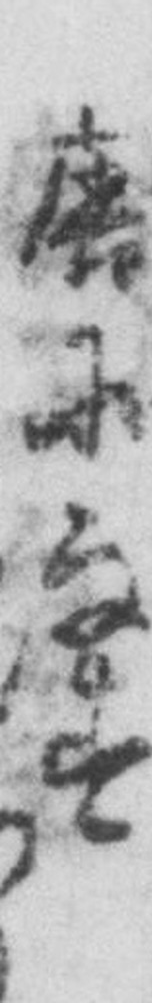唐になす
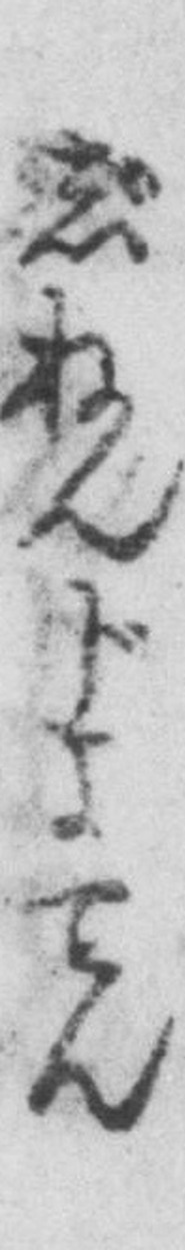じねんじよてん
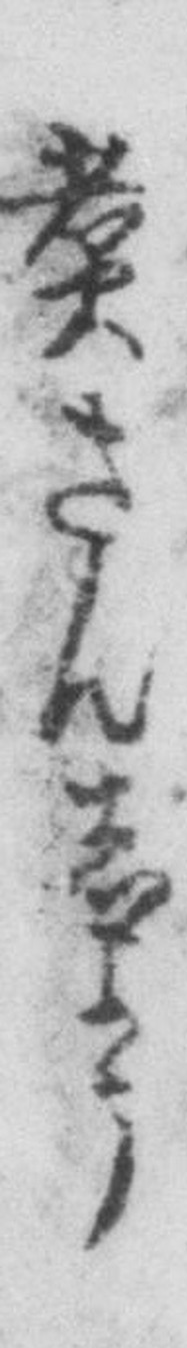煮さんしよう
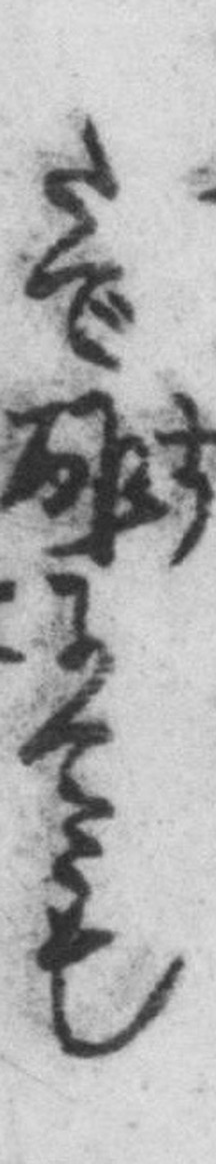たで味噌にても
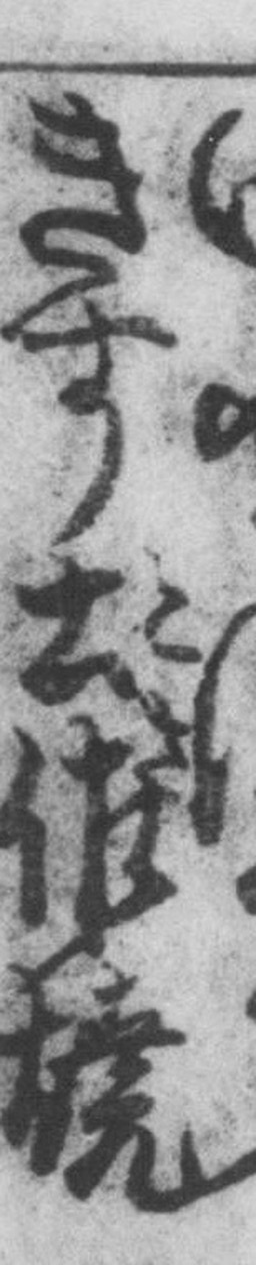きす土佐焼
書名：即席庖丁
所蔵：大阪府立大学学術情報センター 国文学研究資料館
